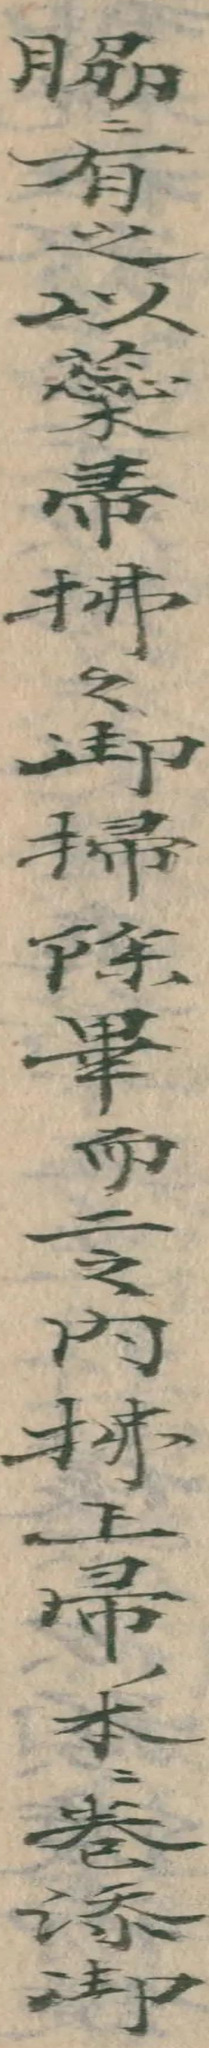脇ニ有之以蘂帚払之御掃除畢而二之内払上帚ノ本ニ巻添御
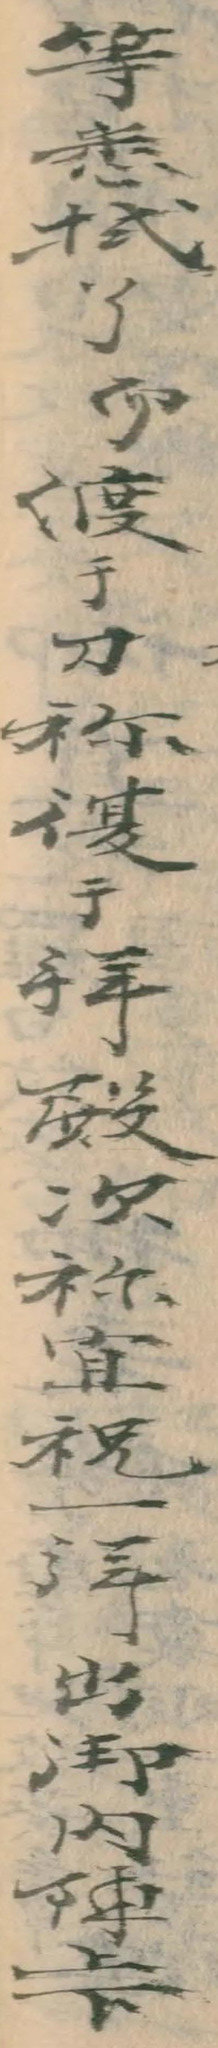等悉拭了而渡于刀祢復于拝殿次称宜祝一拝出御内陳上下
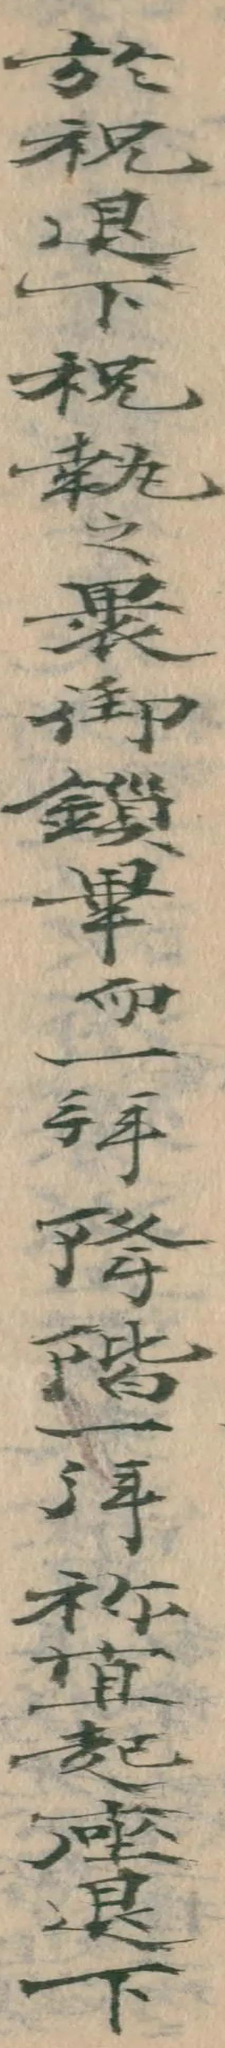於祝退下祝執之褁御鎖畢而一拝降階一拝祢宜起座退下
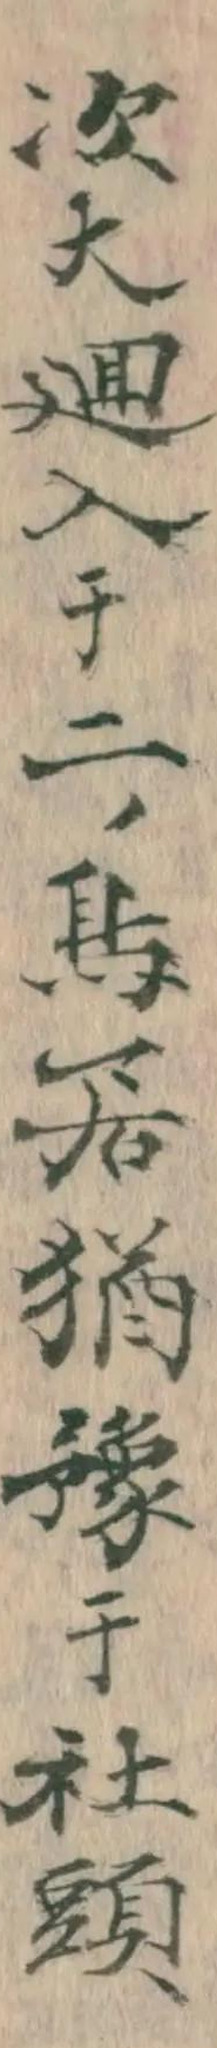次大廻入于二ノ鳥居猶予于社頭
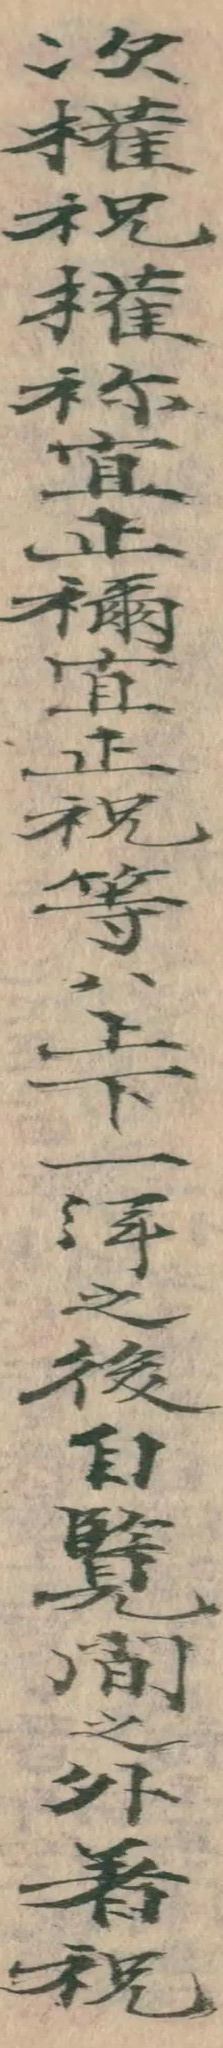次権祝権祢宜正祢宜正祝等ハ上下一拝之後自覧間之外着祝
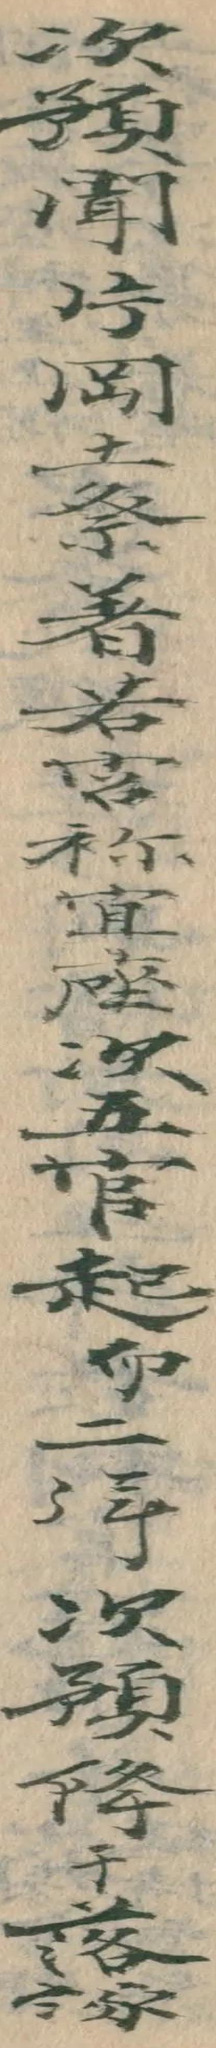次預聞片岡土祭着若宮祢宜座次五官起而二拝次預降于落縁
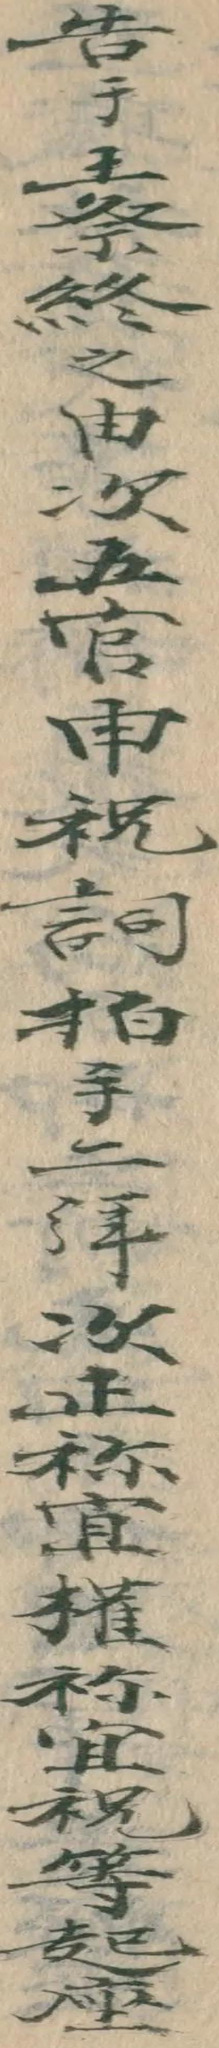告于土祭終之由次五官申祝詞拍手二拝次正祢宜権弥宜祝等起座

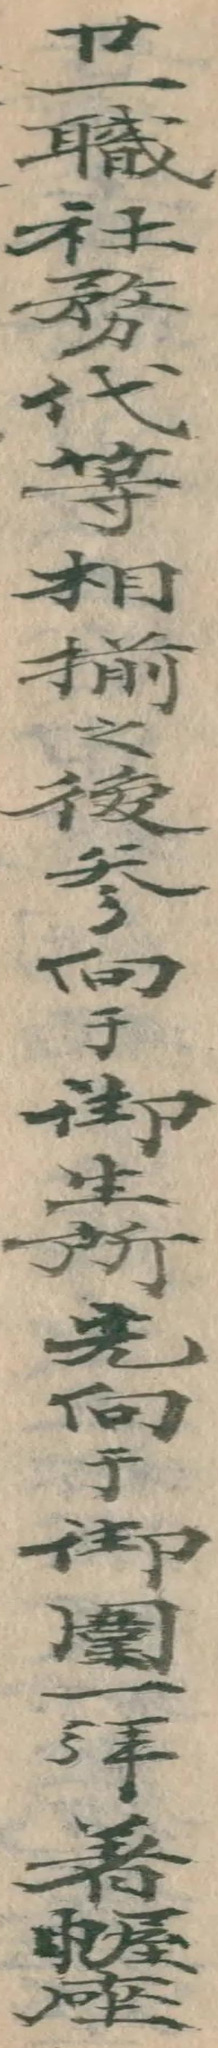廿一職社務代等相揃之後参向于御生所先向于御囲一拝着幄座
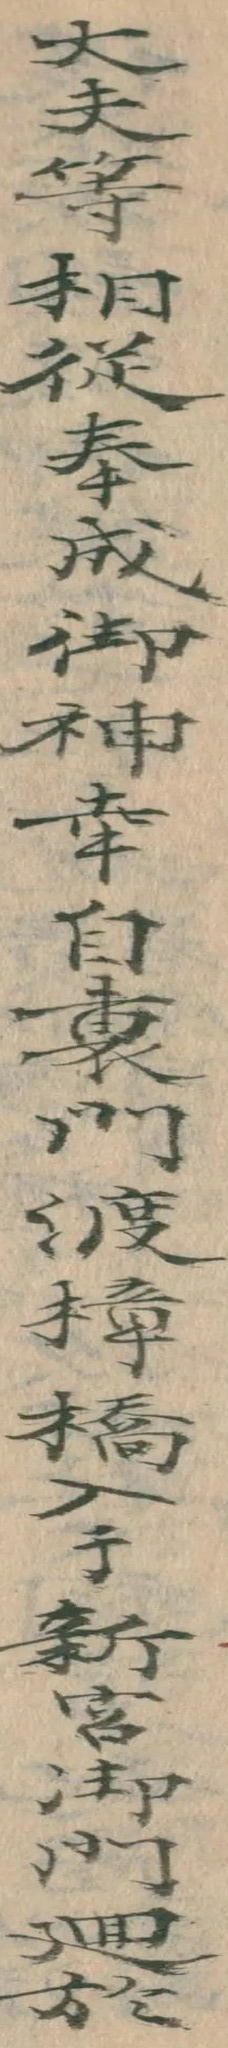大夫等相従奉成御神幸自裏門渡樟橋入于新宮御門廻於
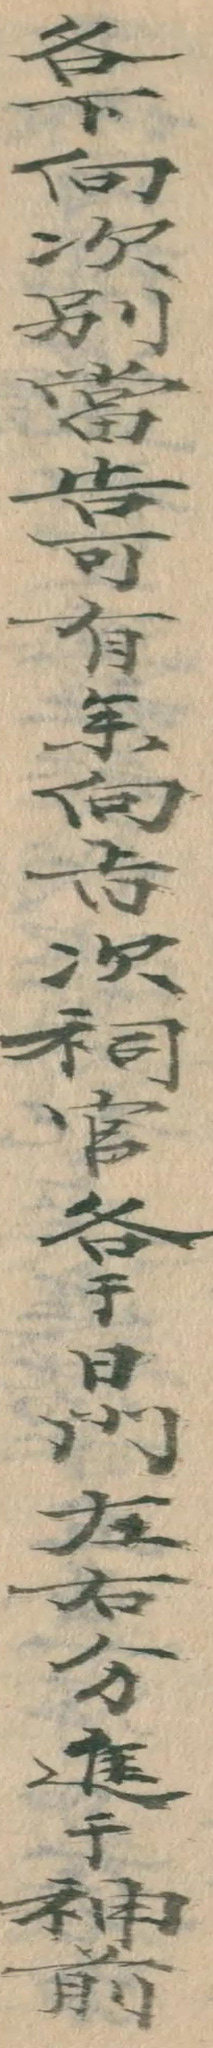各下向次別当告可有参向旨次祠官各于日門左右分進于神前
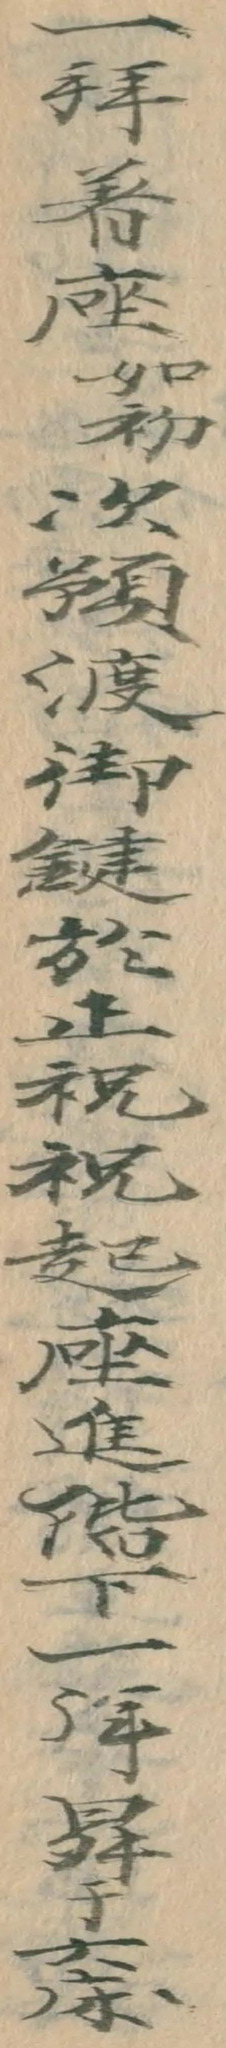一拝着座如初次預渡御鍵於正祝祝起座進階下一拝昇于大床

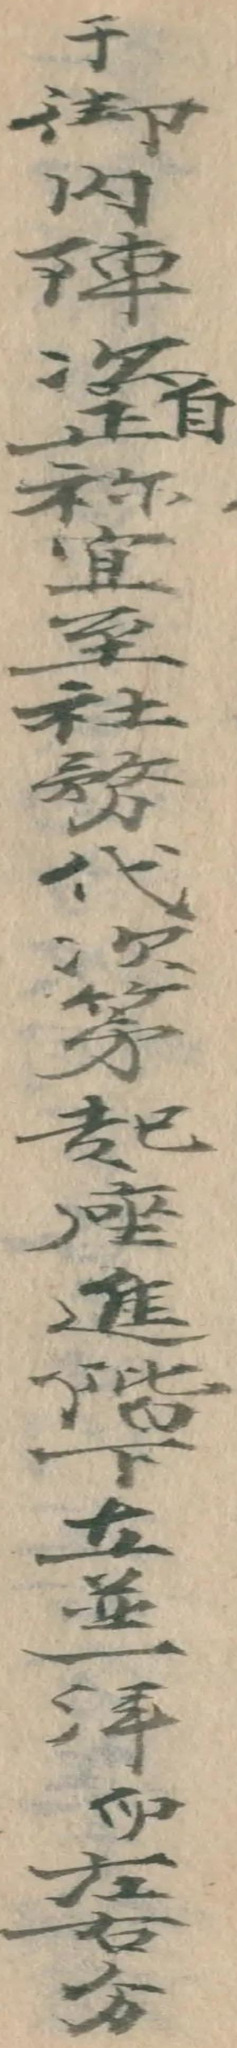于御内陣次◦正祢宜至社務代次第起座進階下立並一拝而左右分
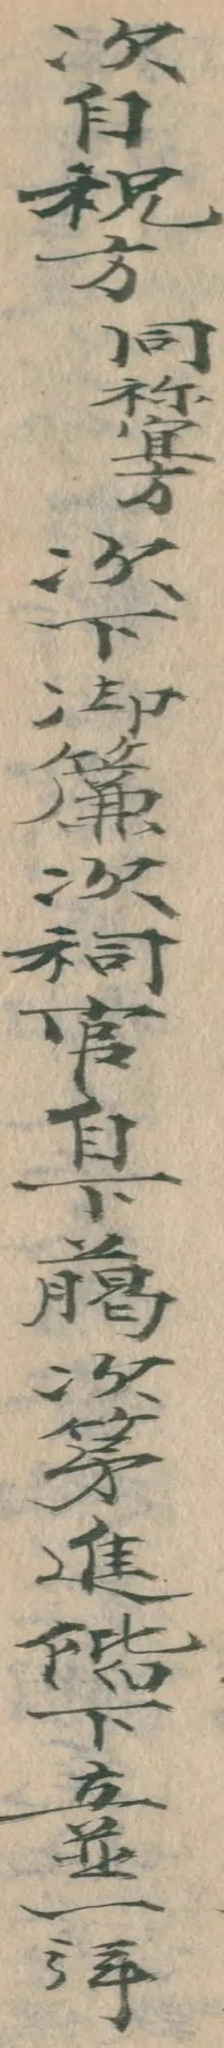次自祝方同祢宜方次下御簾次祠官自下臈次第進階下立並一拝
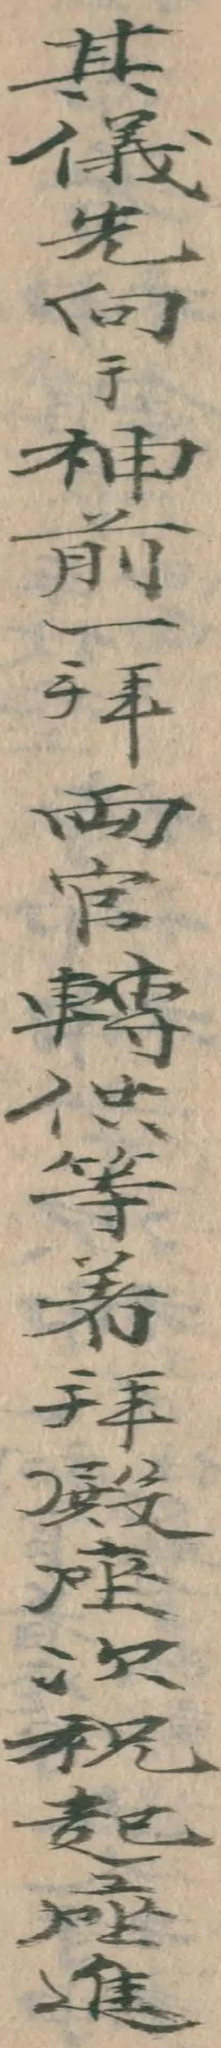其儀先向于神前一拝両官転供等着拝殿座次祝起座進
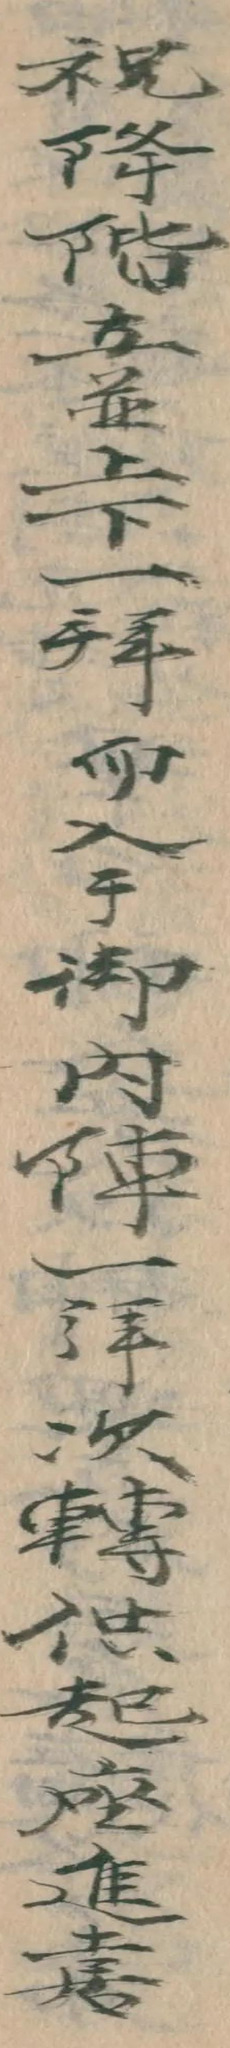祝降階立並上下一拝而入于御内陣一拝次転供起座進土居
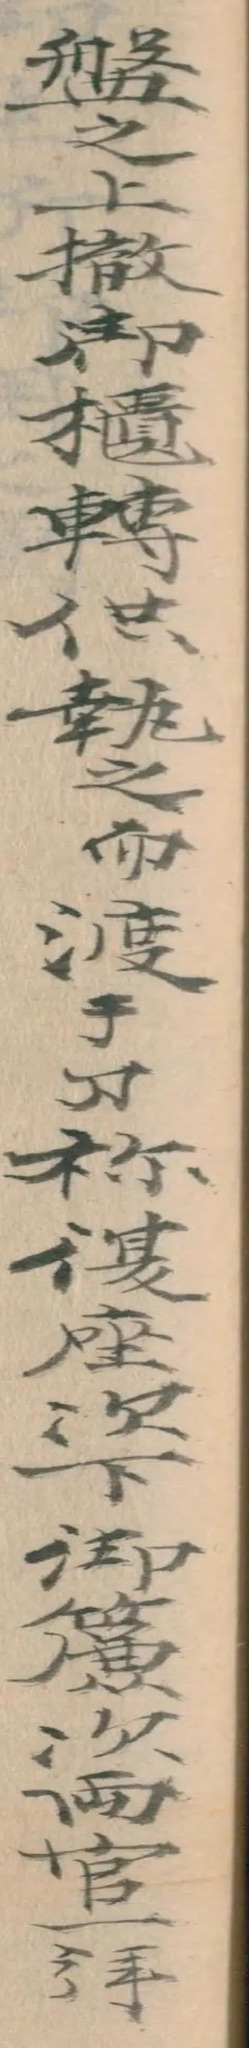盤之上撤御櫃転供執之而渡于刀祢復座次下御簾次両官一拝
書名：賀茂社記録. 第9冊
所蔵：国立国会図書館 National Diet Library, JAPAN
